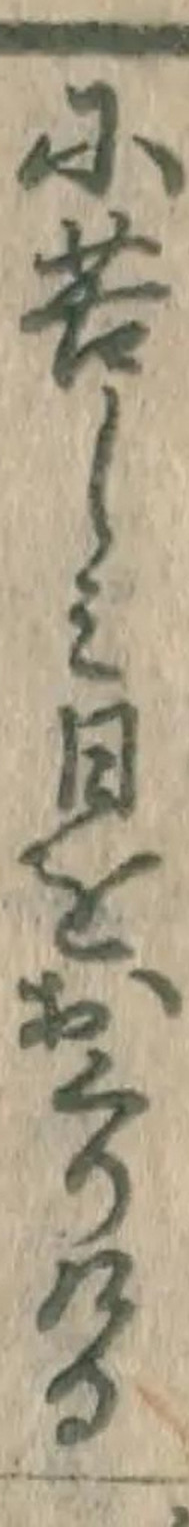に苦しみ日をおくりける
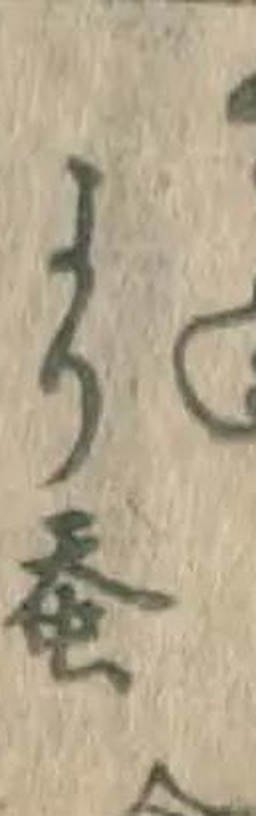より蚕
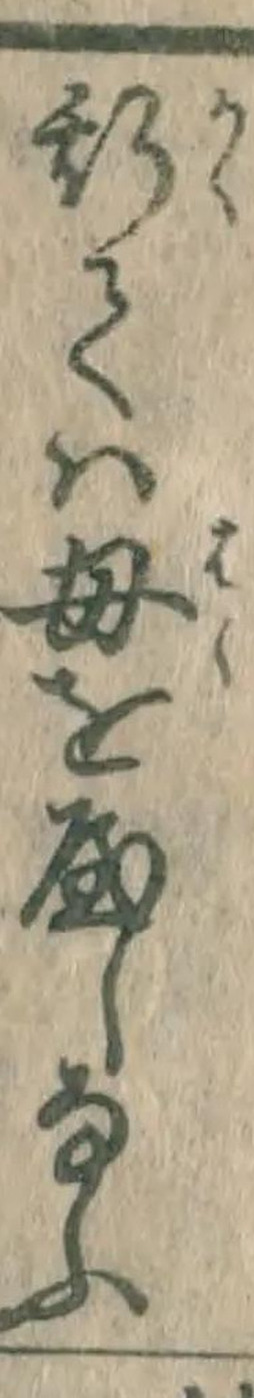斯ては母をやしなふ
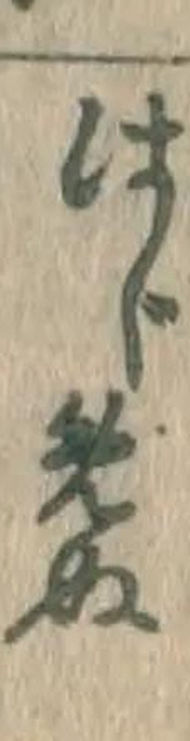はじめぬ
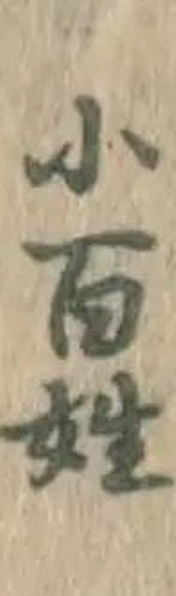小百姓
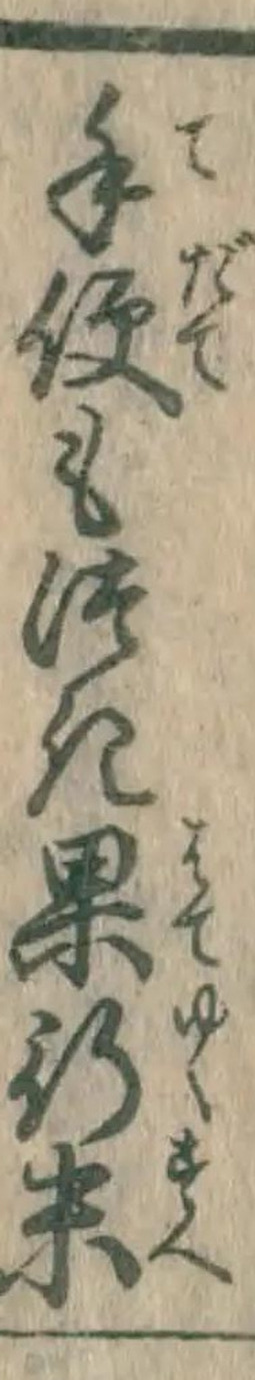手便もつき果行末

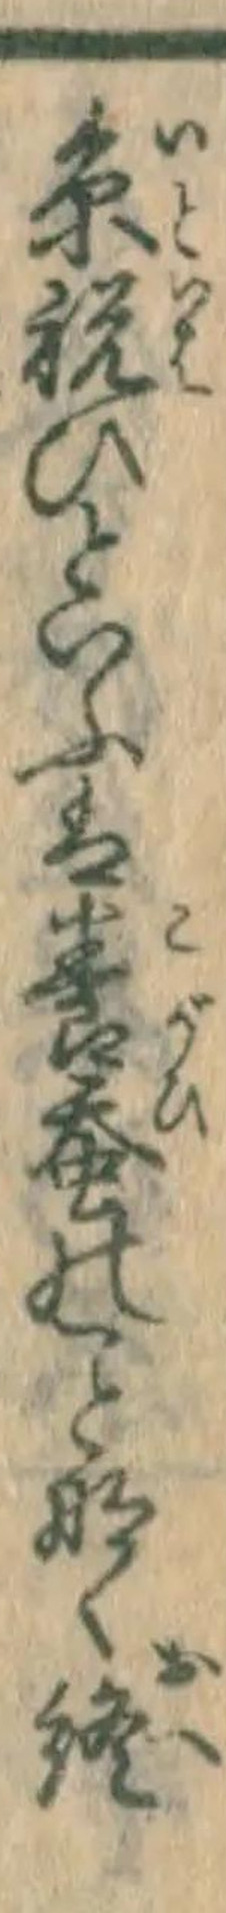糸祝ひといふは養蚕のことなく終
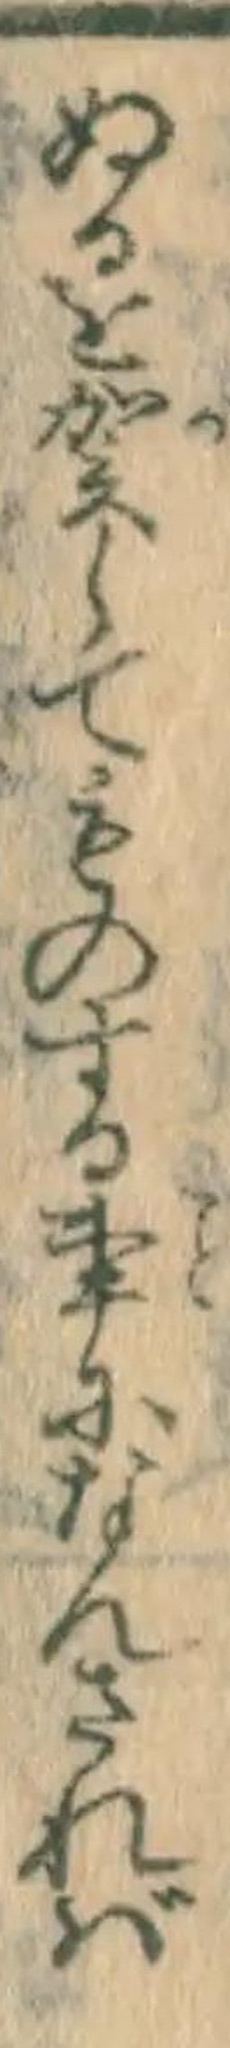ぬるを賀してものする事になんされば
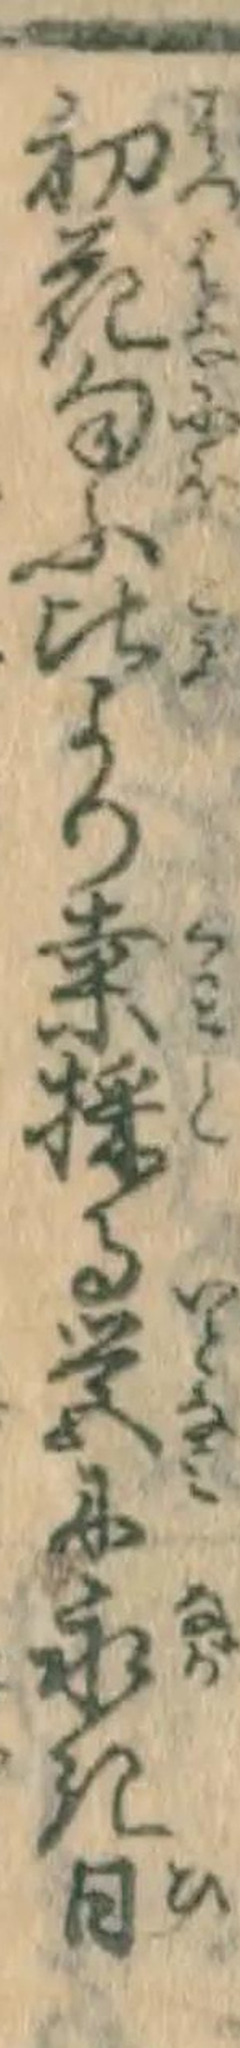初花匂ふ比より桑採る営に永き日
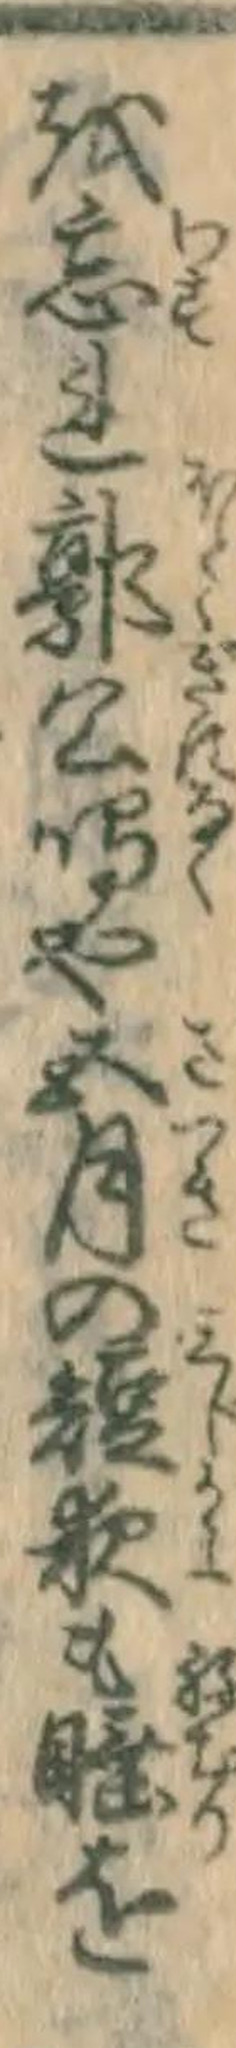を忘れ郭公鳴や五月の短夜も睡を
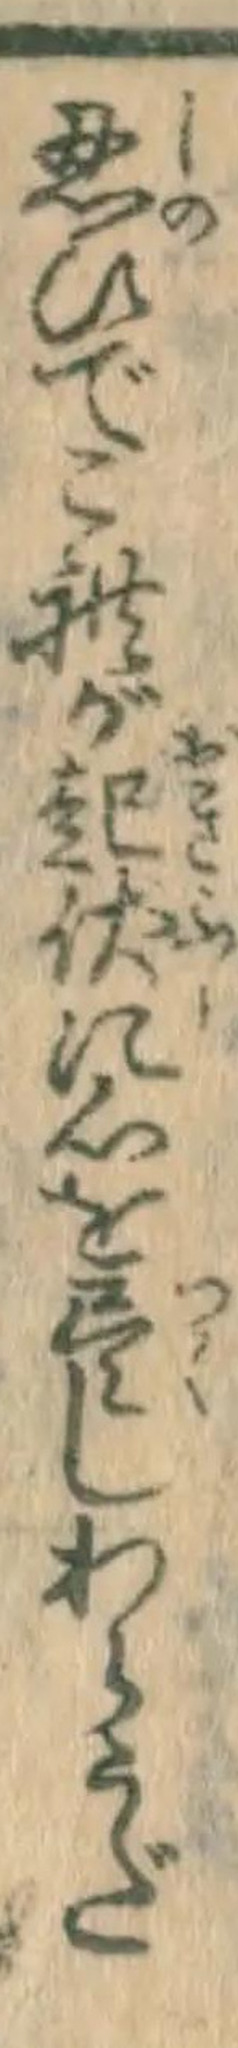忍ひでこれが起伏に心を尽しわらうだ
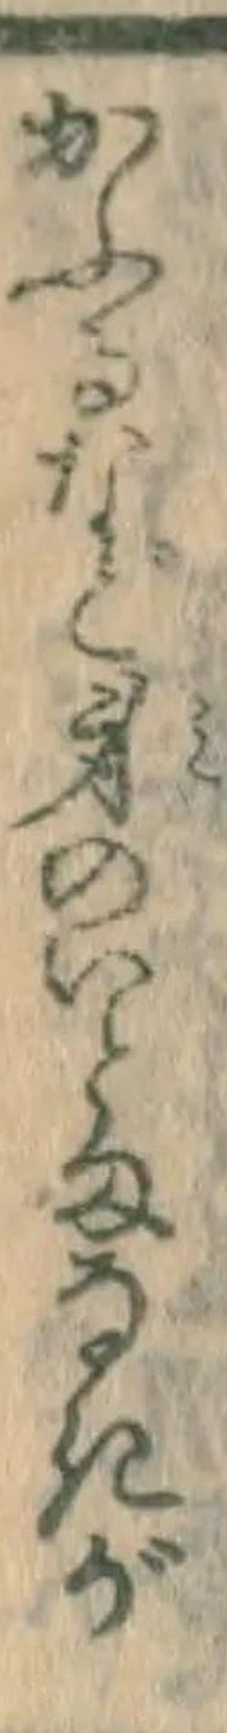かふるなど身のいとまなきが
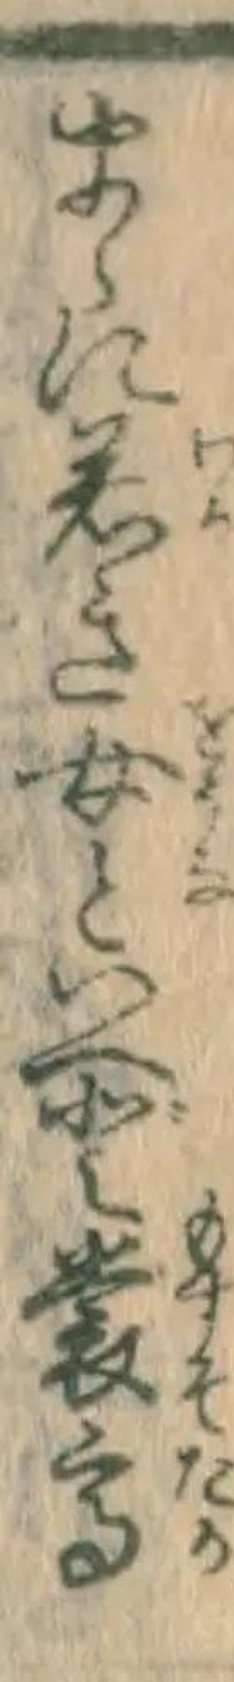まゝに若き女といへど裳高
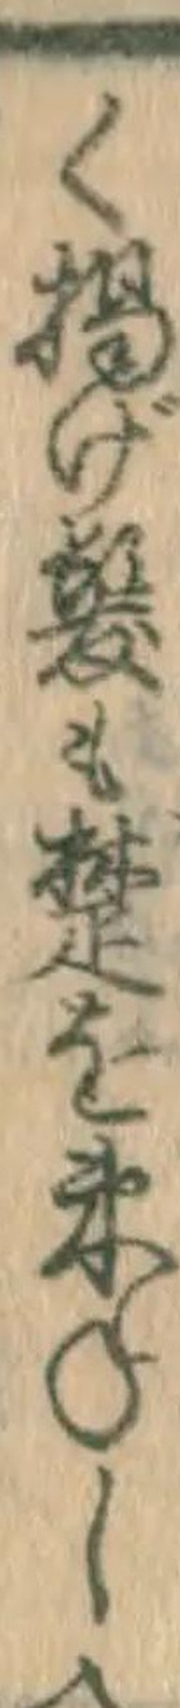く掲げ髪も楚を束ねし
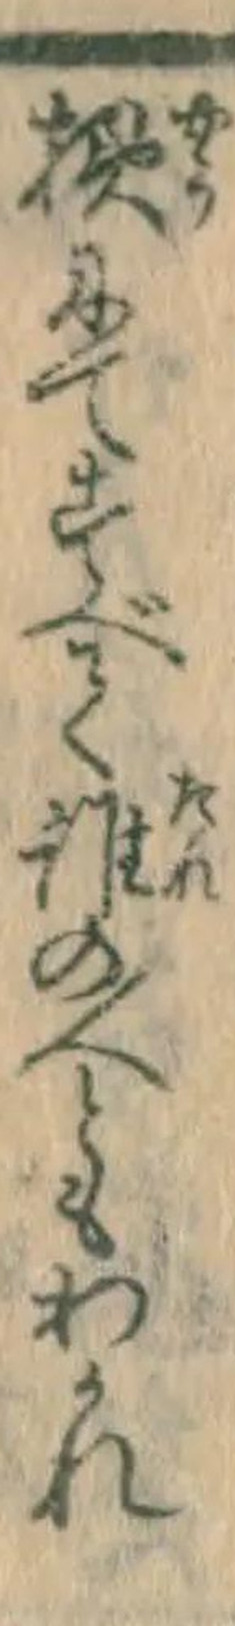様にてすべて誰の人ともわかれ
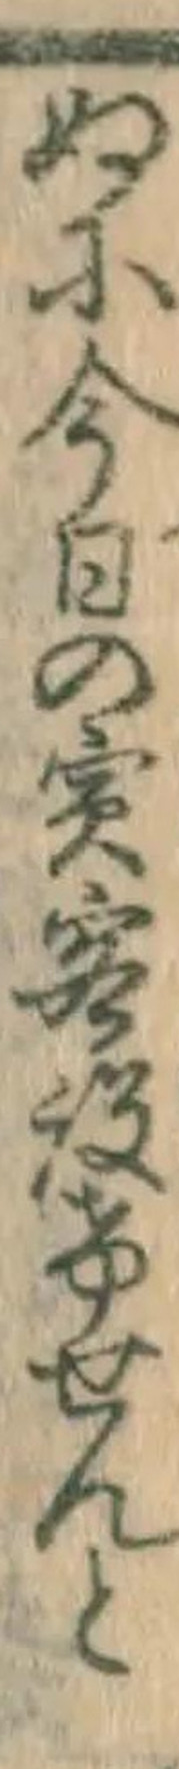ぬに今日の賓客設けせんと
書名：養蚕秘録 3巻. [3]
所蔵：国立国会図書館 National Diet Library, JAPAN
